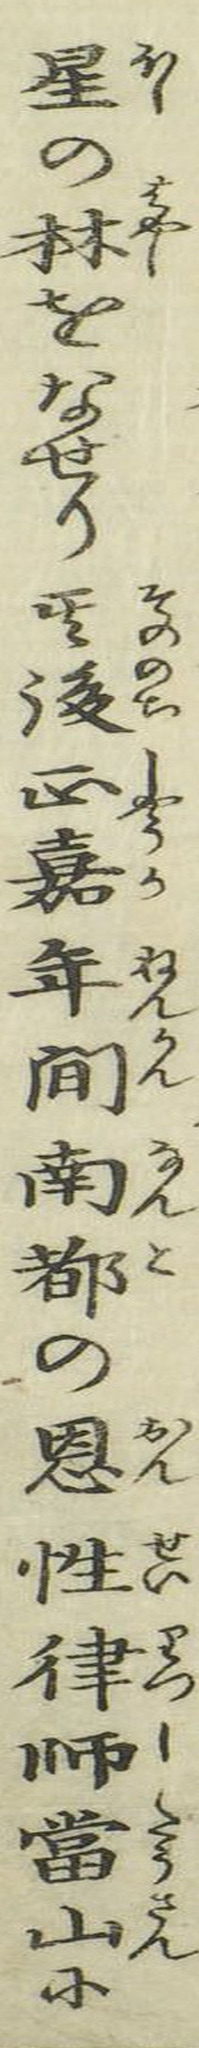星の林をなせり其後正嘉年間南都の恩性律師當山に

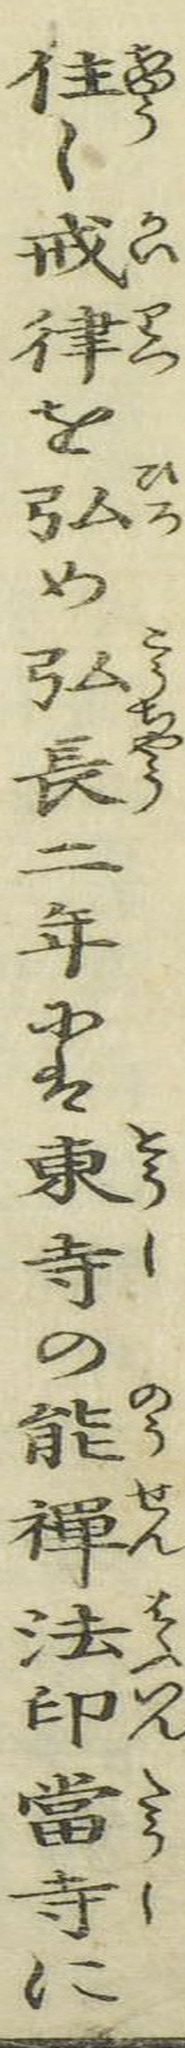住し戒律を弘め弘長二年には東寺の能禪法印當寺に
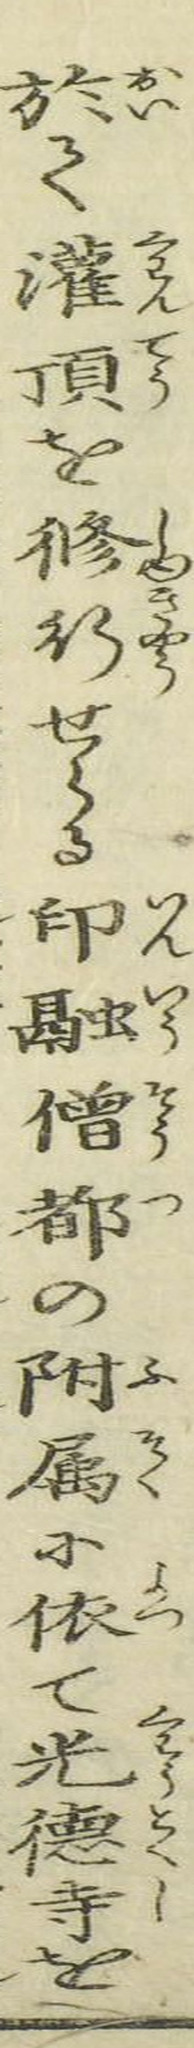於て灌頂を修行せらる印融僧都の附属に依て光德寺を
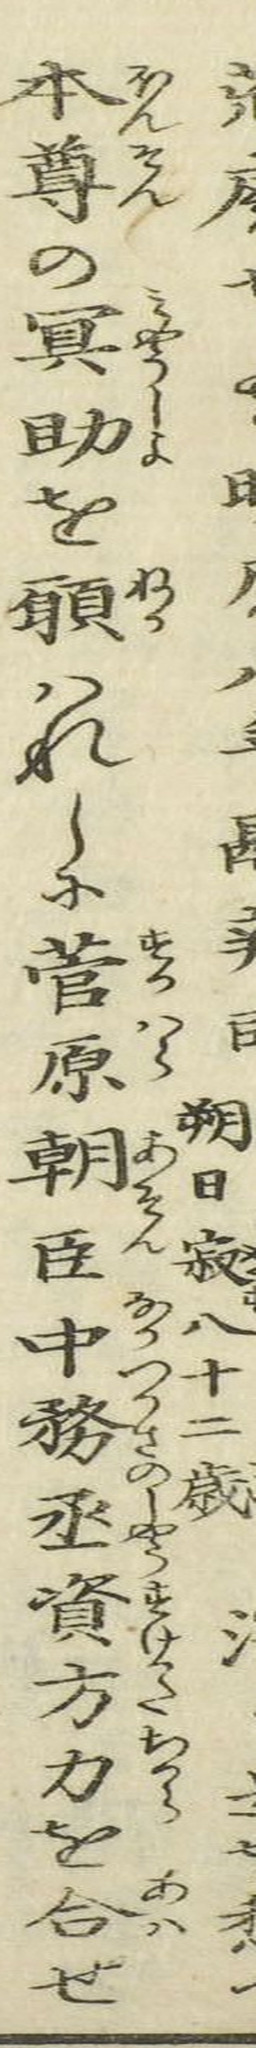本尊の冥助を願はれしに菅原朝臣中務丞資方力を合せ
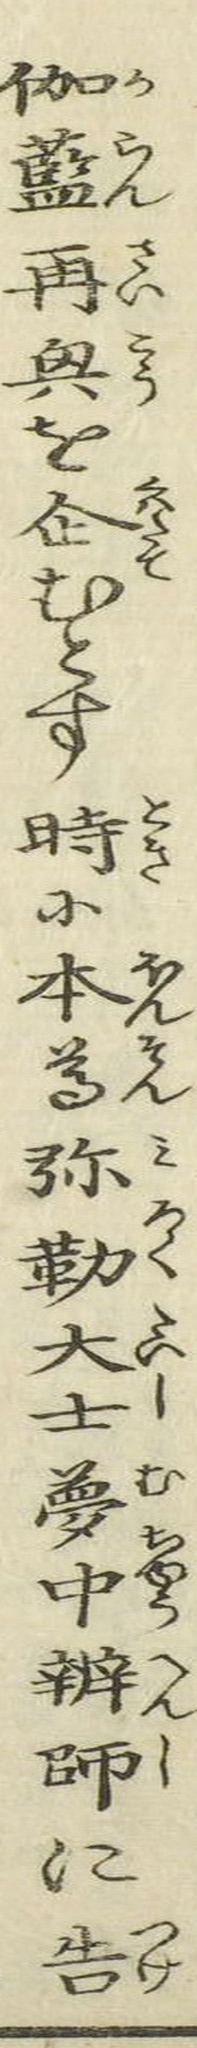伽藍再興を企むとす時に本尊弥勒大士夢中辨師に告
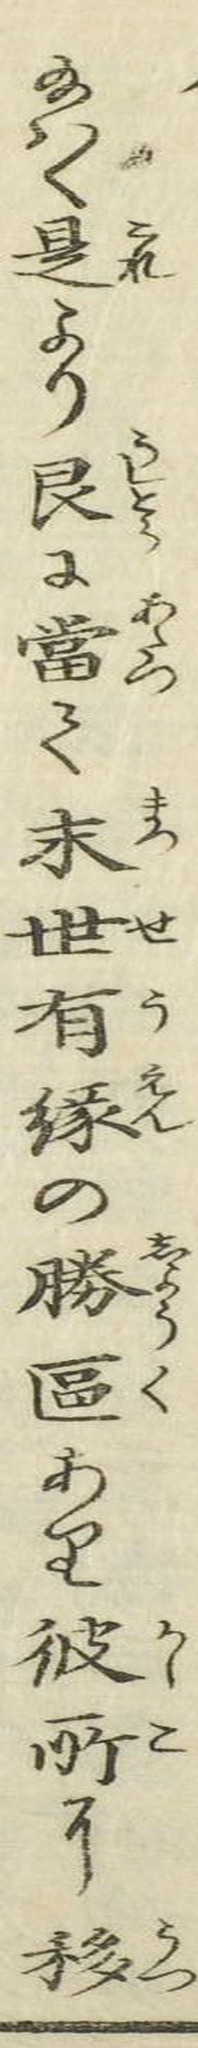給はく是より艮に當て末世有縁の勝區あり彼所に移
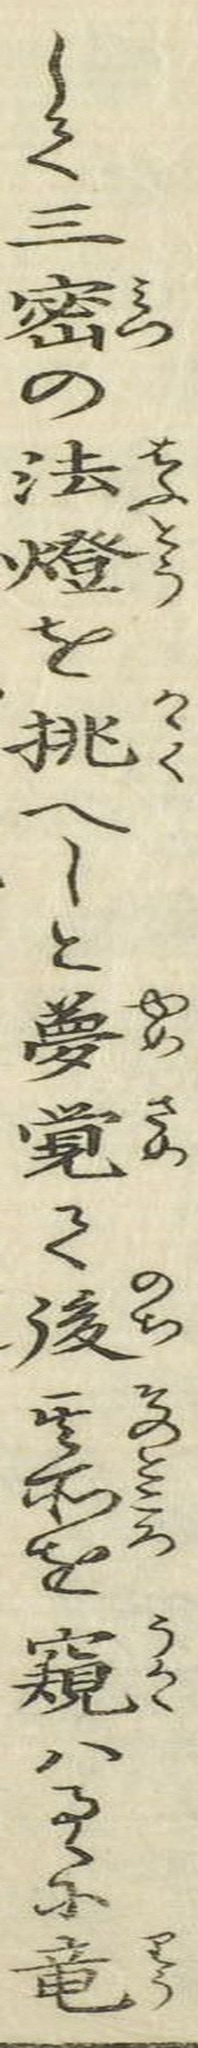して三密の法燈を挑へしと夢覚て後其所を窺はるゝに竜
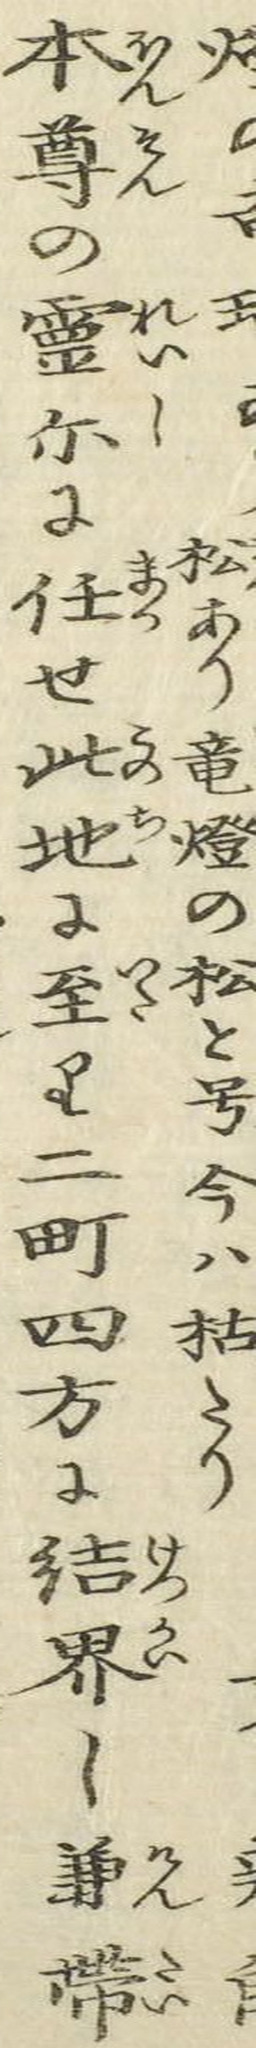本尊の靈尓に任せ此地に至り二町四方に結界し兼帯
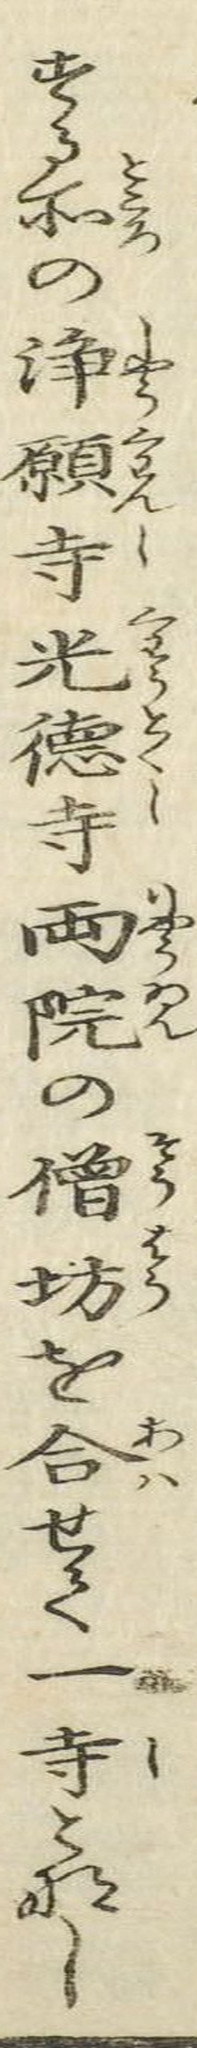する所の浄願寺光德寺両院の僧坊を合せて一寺となし
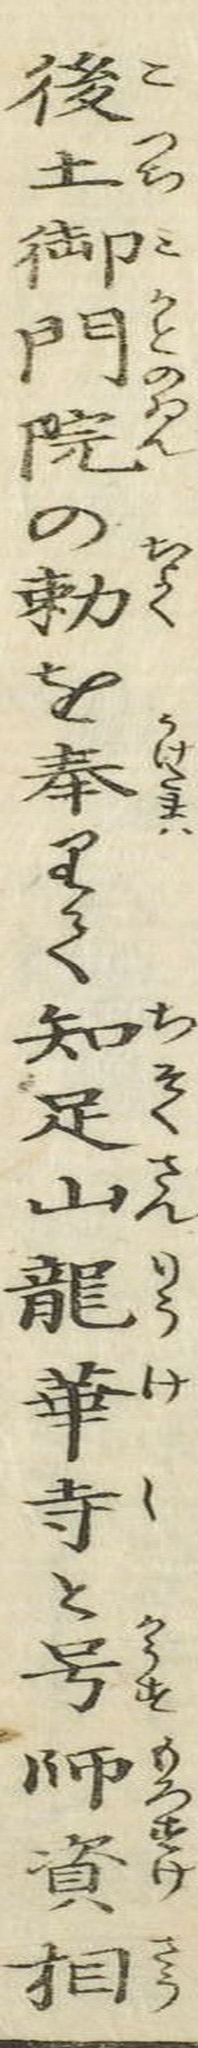後土御門院の勅を奉りて知足山龍華寺と号師資相
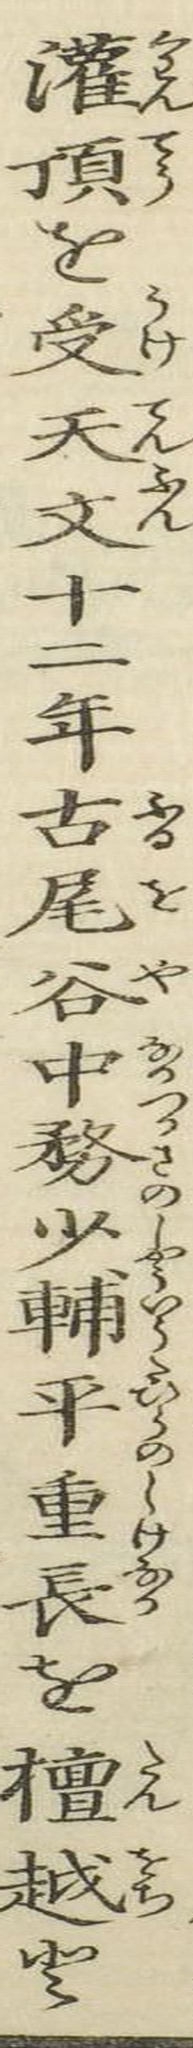灌頂を受天文十二年古尾谷中務少輔平重長を檀越と
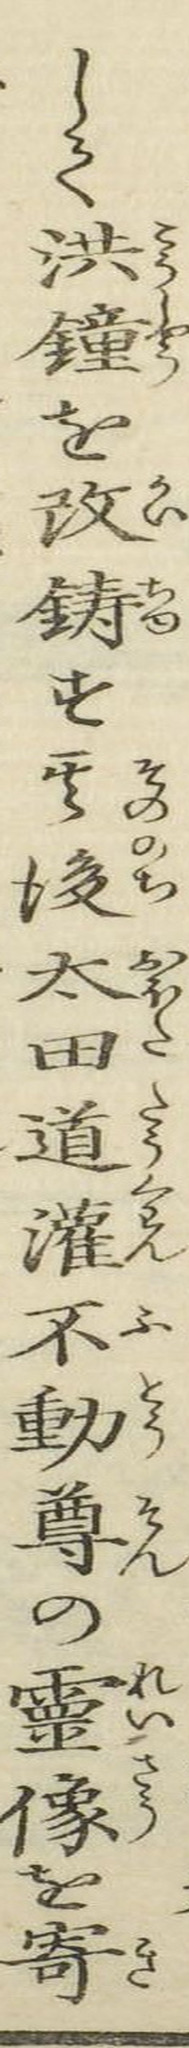して洪鐘を改鋳す其後太田道潅不動尊の靈像を寄
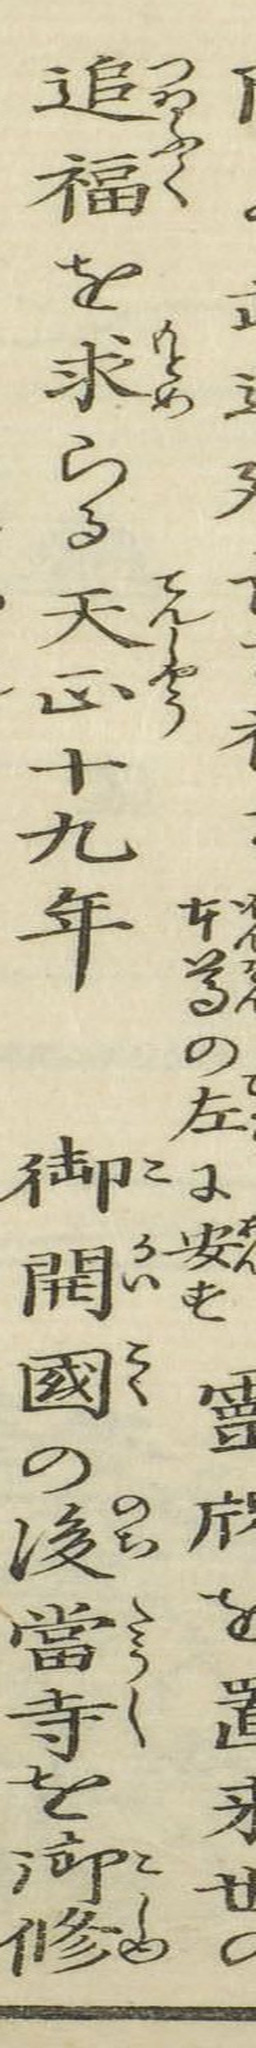追福を求らる天正十九年御開國の後當寺を御修
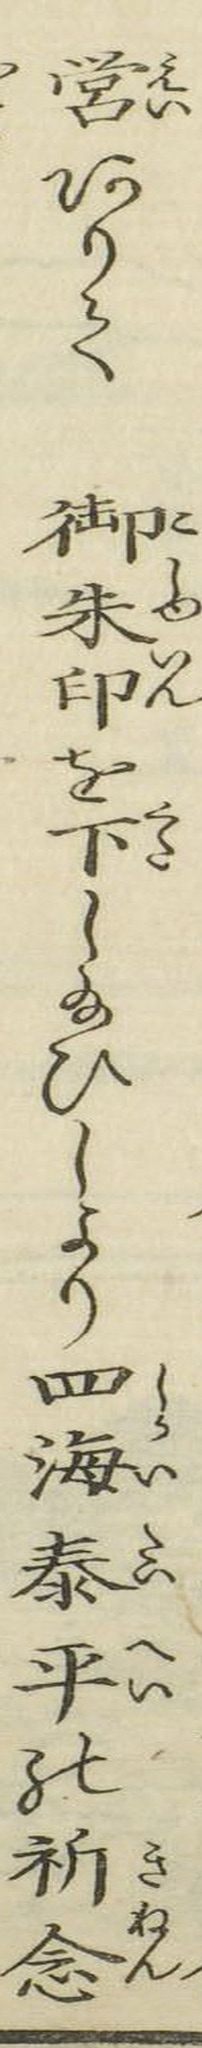営ありて御朱印を下し給ひしより四海泰平の祈念
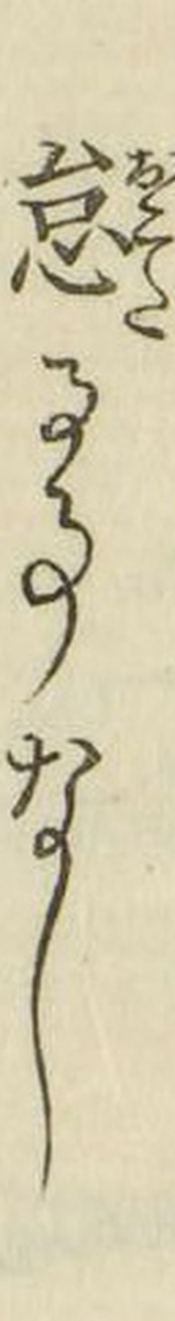怠る事なし
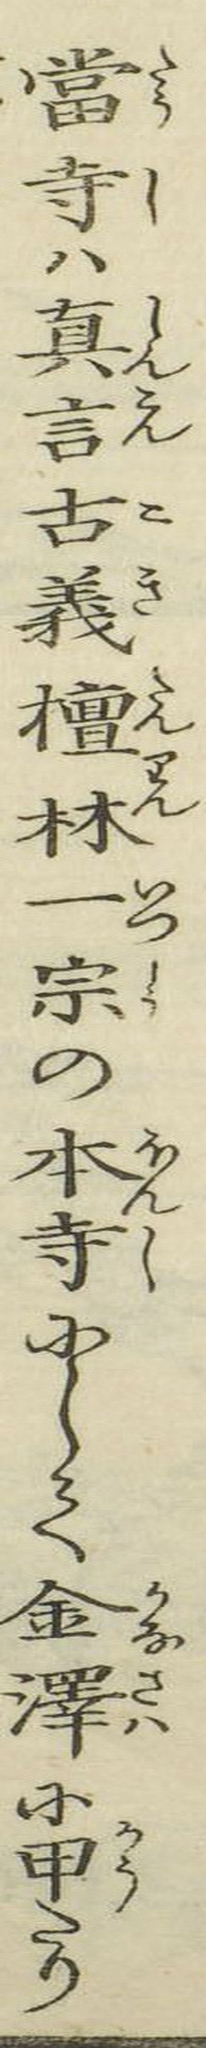當寺は真言古義檀林一宗の本寺にして金澤に甲たり
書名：江戸名所図会 20巻 巻之6
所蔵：東京学芸大学教育コンテンツアーカイブ
